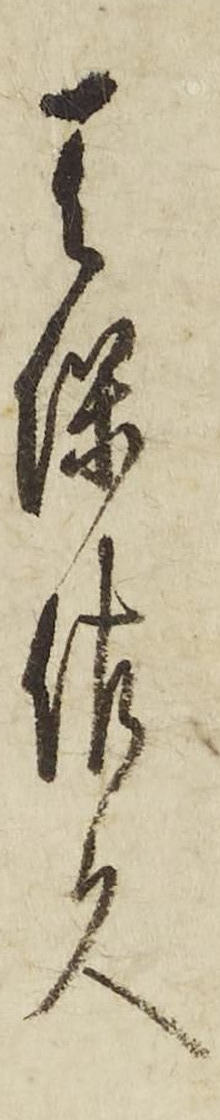天保佐久
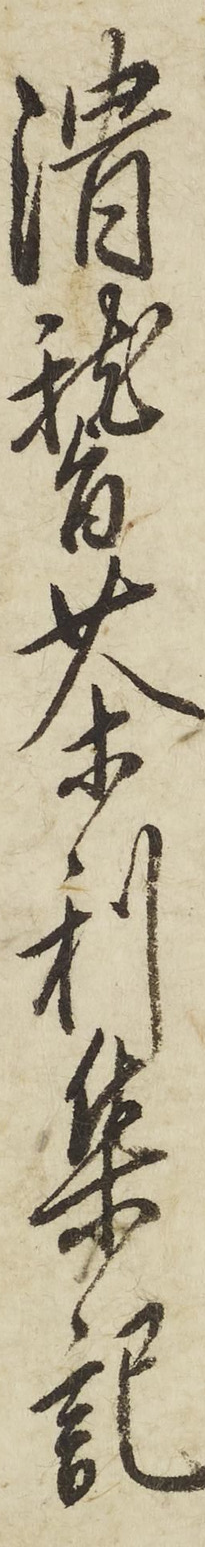滑稽茶利集記

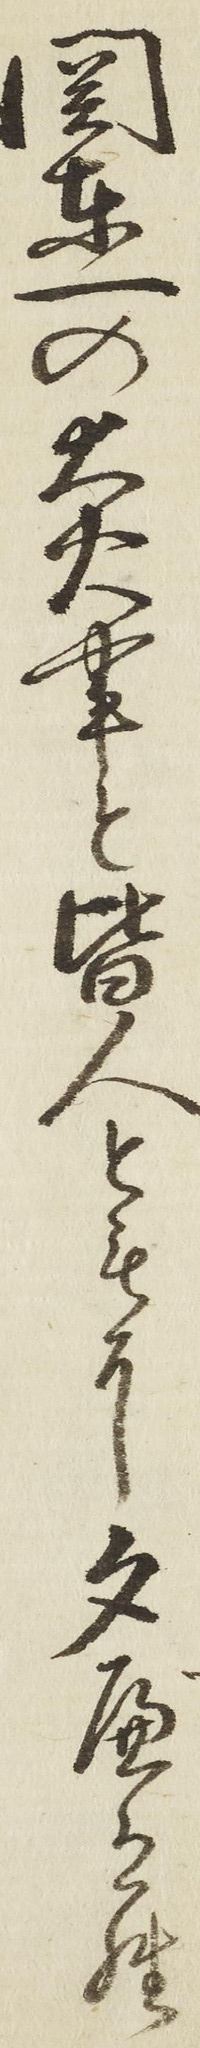関東一の大火事と皆人ともに夕べから
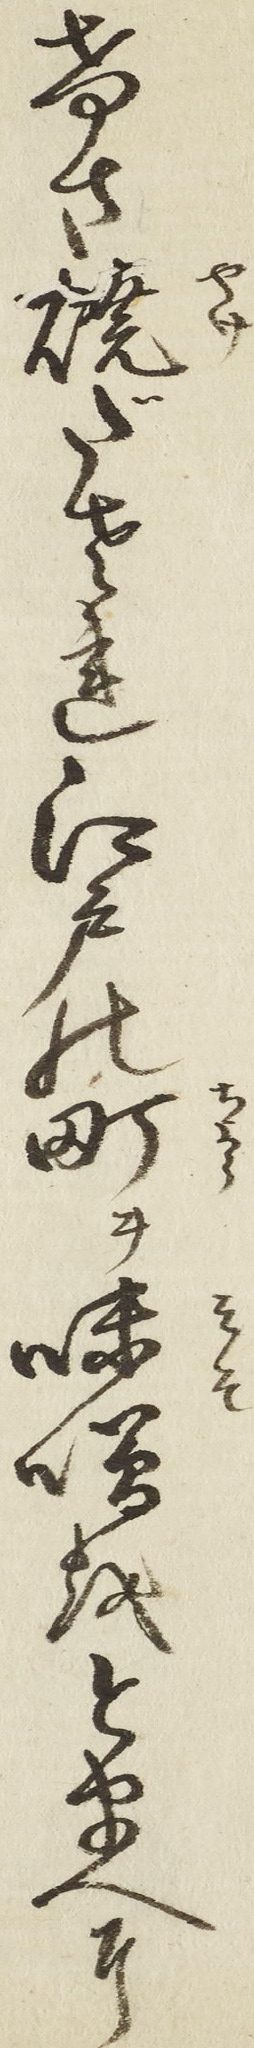けさ焼だされ江戸の町ヲ味噌をとまへに
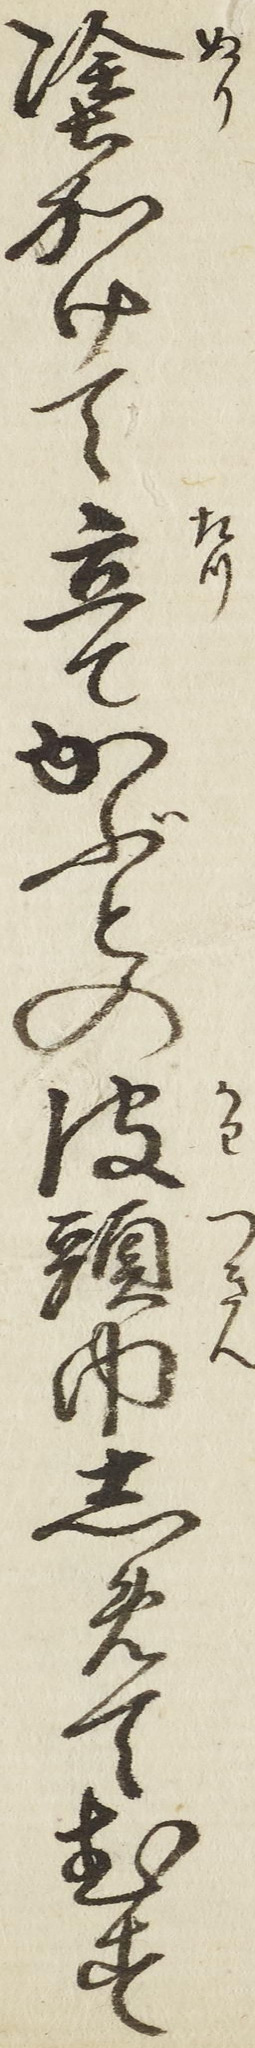塗かけて立てかぶとの皮頭巾しめてむす
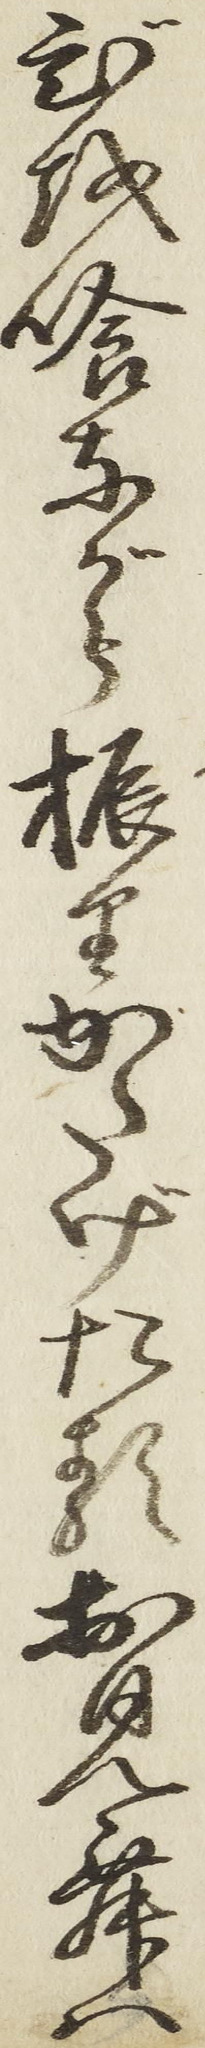びを喰ながら振りかたげたるお見舞ハ
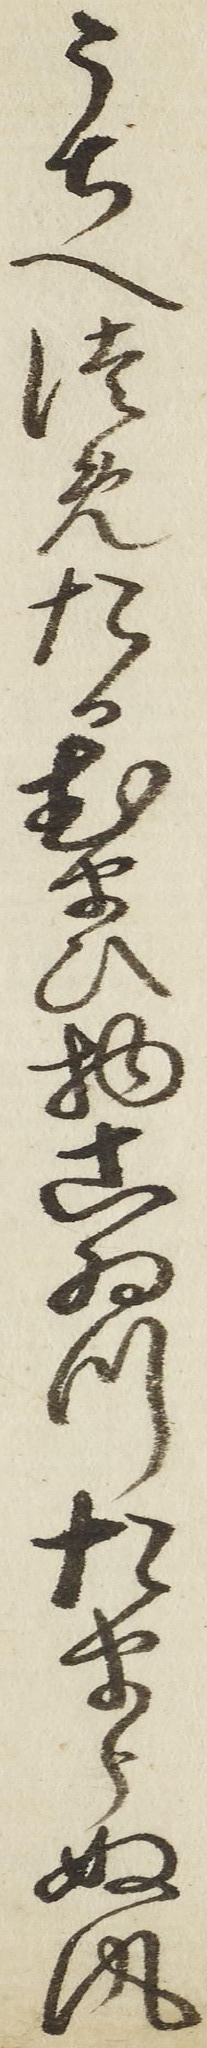うちへつめたるむまひ物こいつたまらぬ風
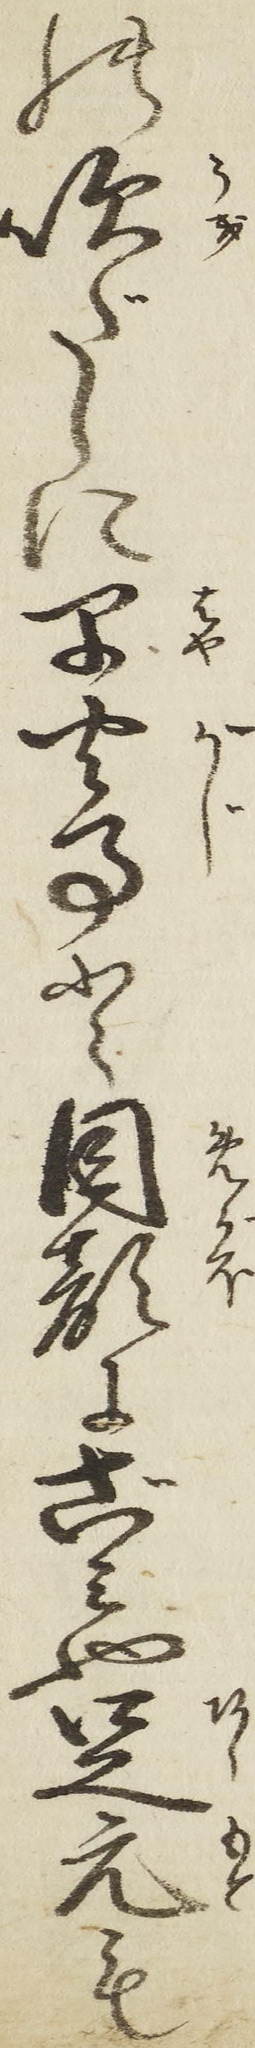の吹だしに早火事と目顔にごミや足元も

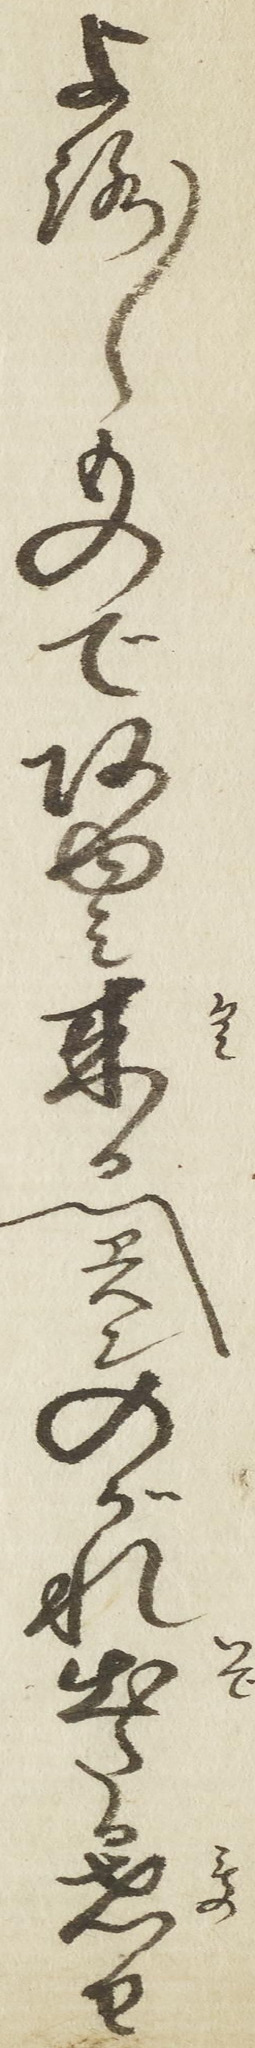よろ〳〵ものであゆミ来る〽エㇸンのがれ出たる者は
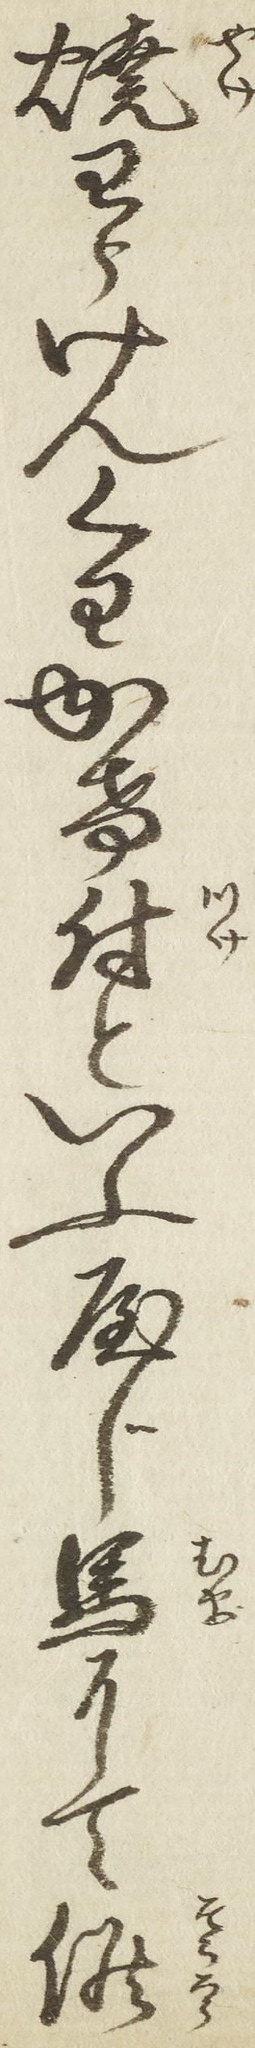焼わらけんくわかけ付といふやじ馬にて候
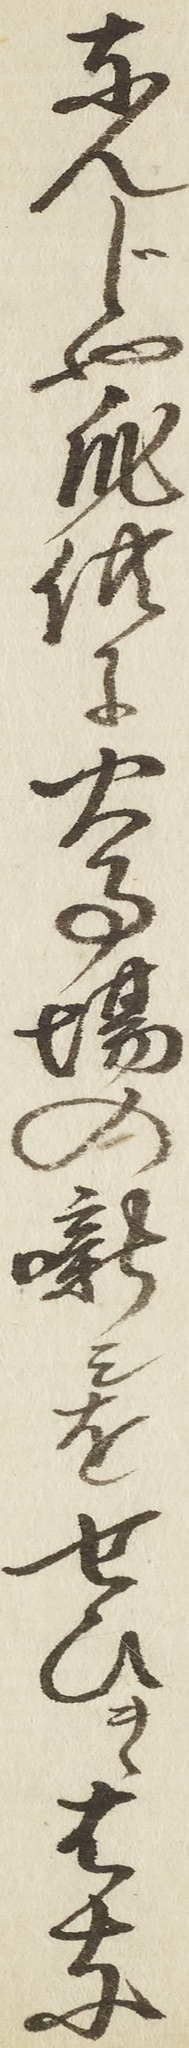なんじや身供に火事場の噺シをせひヲヽはな
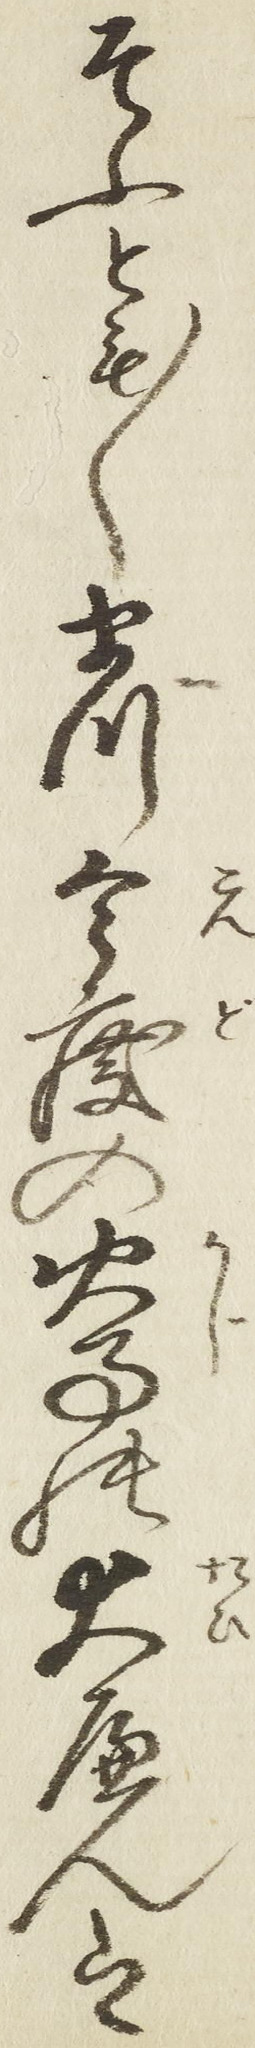そふとも〳〵まづ今度の火事の大へんは
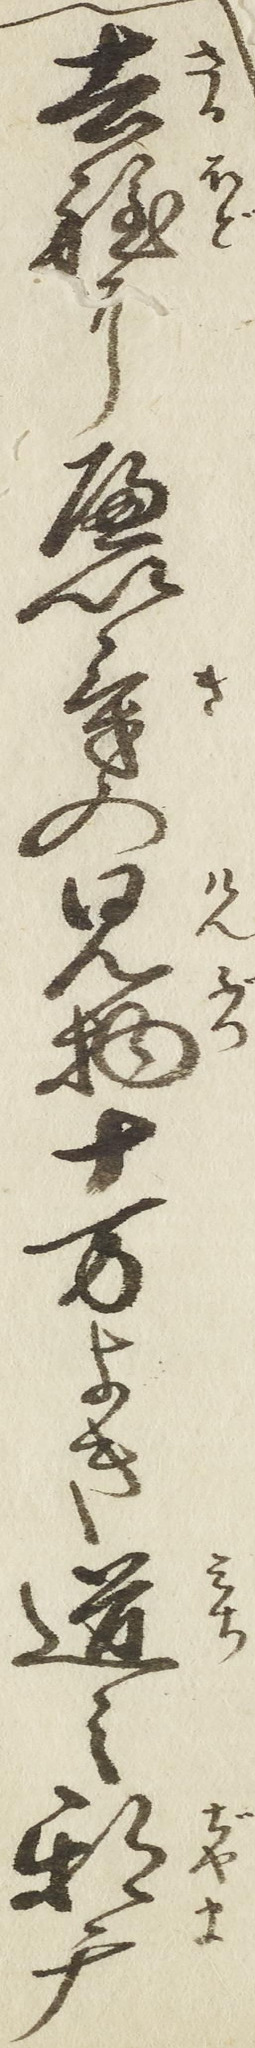〽去程にへい気の見物十万よき道之邪魔
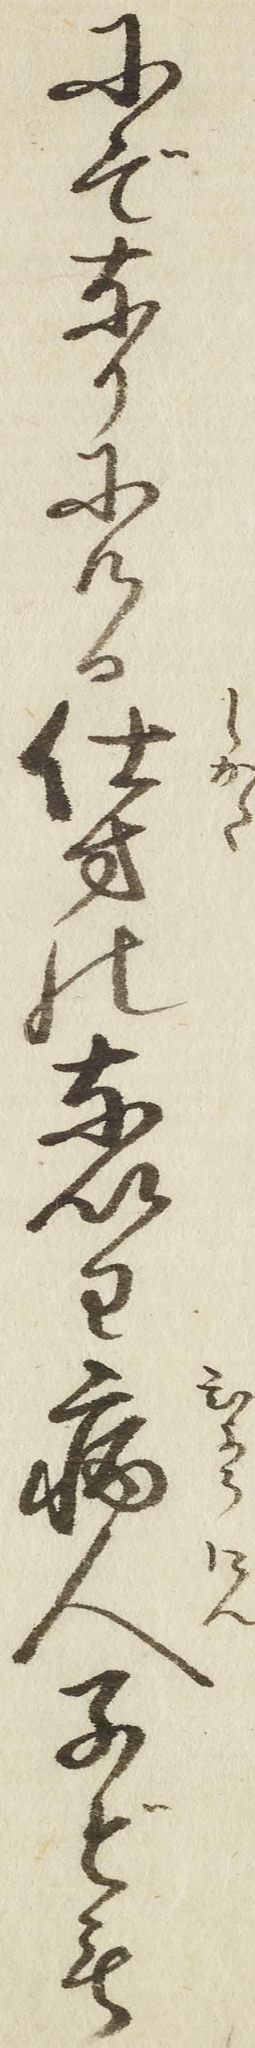にぞなりにける仕方のないわ病人子ども
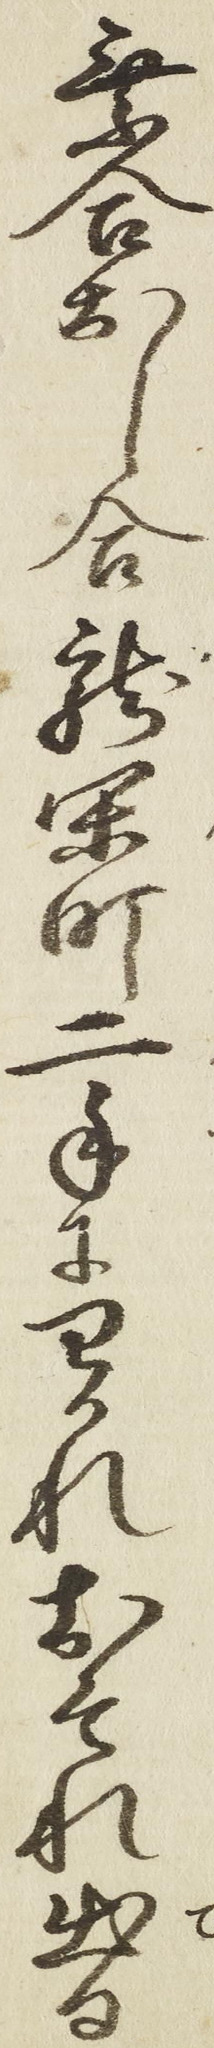乗合おし合龍閑町二手にわかれおそれ出る
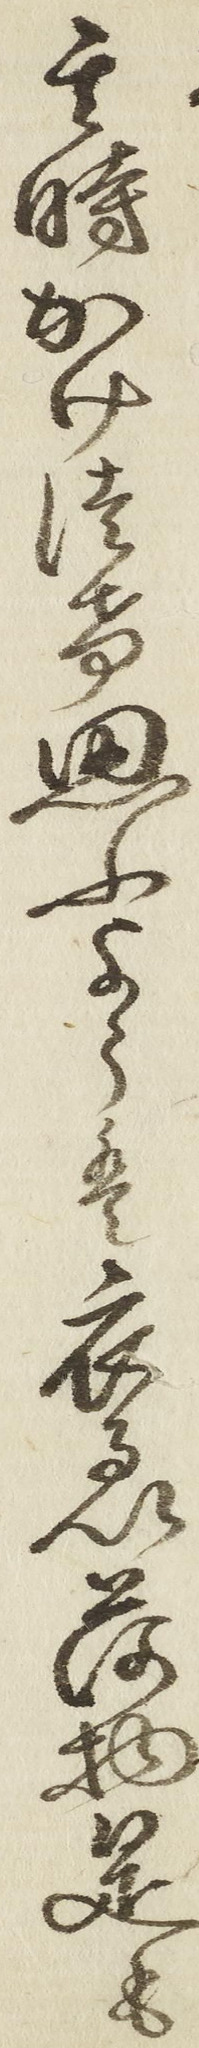其時かけつけ思ふようは衣るい荷物是も
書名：天保佐久　滑稽茶利集記
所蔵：東京大学地震研究所図書室 Earthquake Research Institute Library, The University of Tokyo, JAPAN
